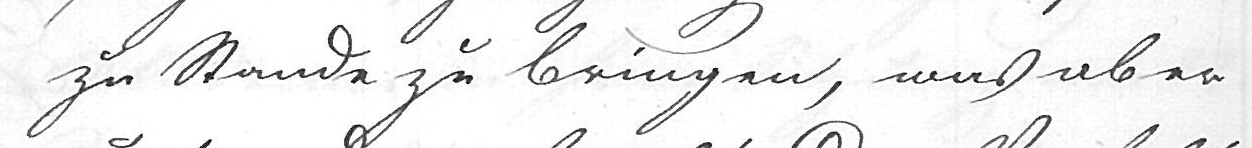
zu Stande zu bringen, was aber
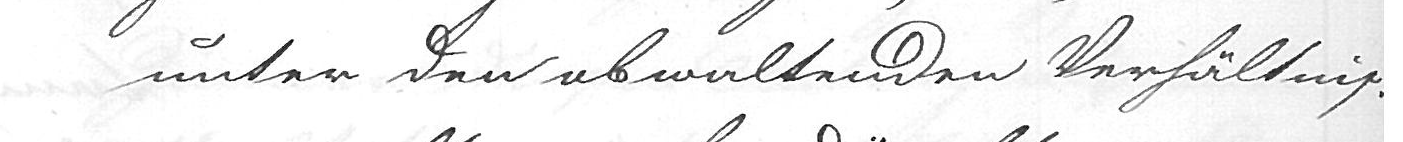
unter den obwaltenden Verhältnis-
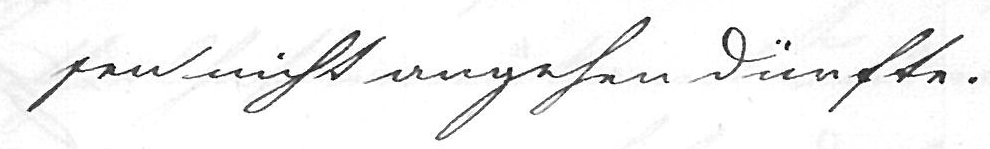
sen nicht angehen dürfte.
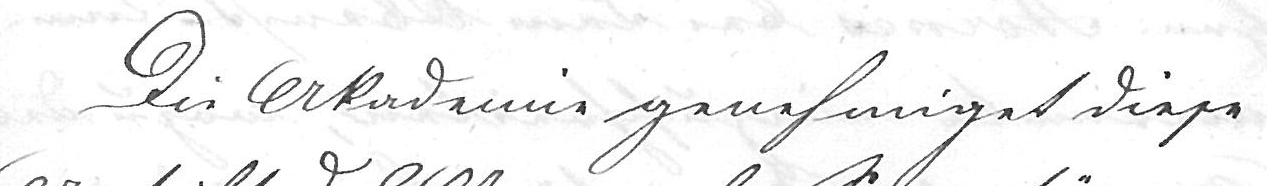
Die Akademie genehmiget diese
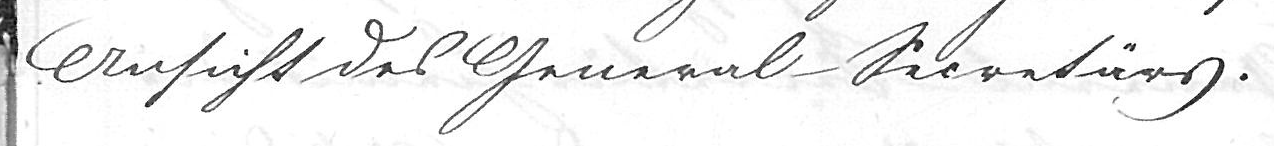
Ansicht des General-Secretärs.
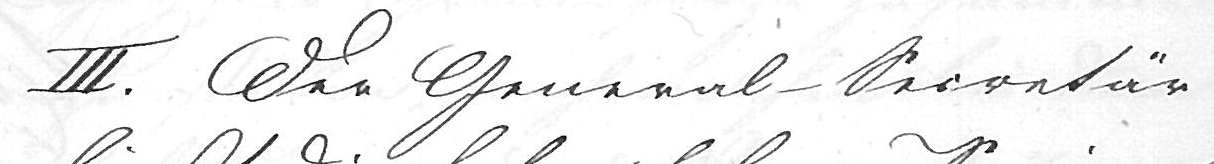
III. Der General-Secretär
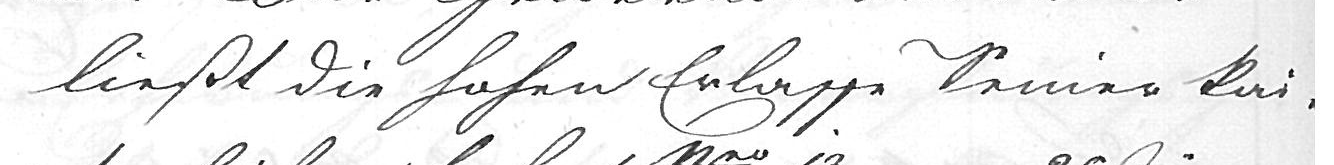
ließt die hohen Erlasse Seiner Kai-
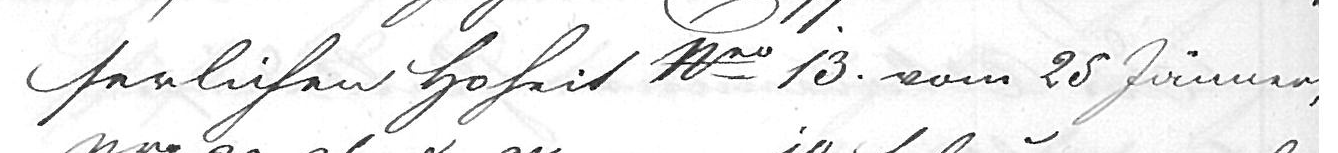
serlichen Hoheit Nro. 13. vom 25. Jänner,
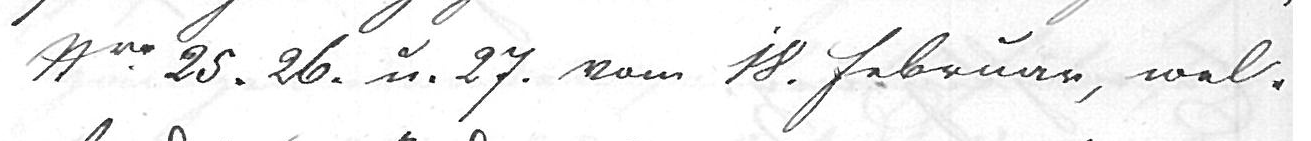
Nro. 25. 26. u. 27. vom 18. Februar, wel-
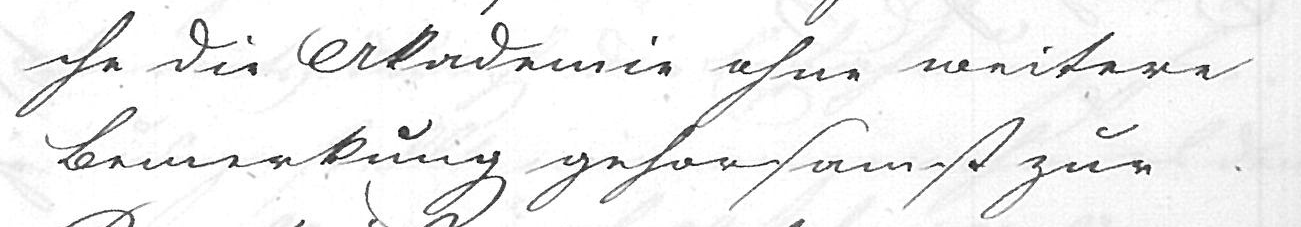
che die Akademie ohne weitere
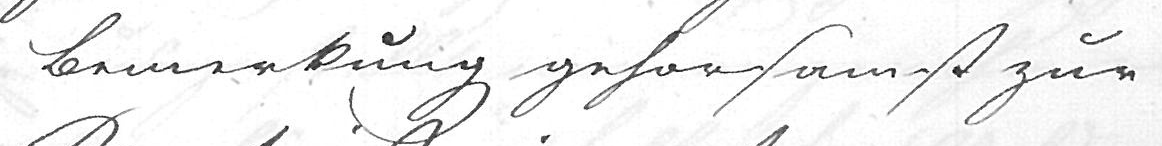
Bemerkung gehorsamst zur
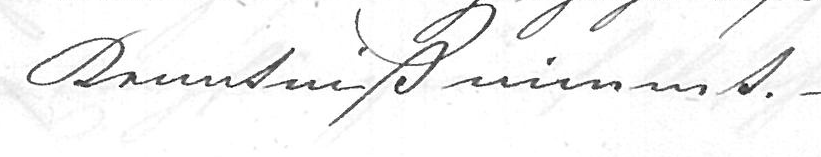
Kenntniß nimmt.
